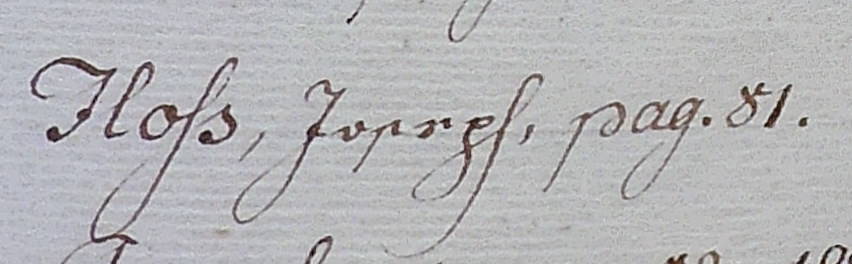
Floss, Joseph, pag. 81.
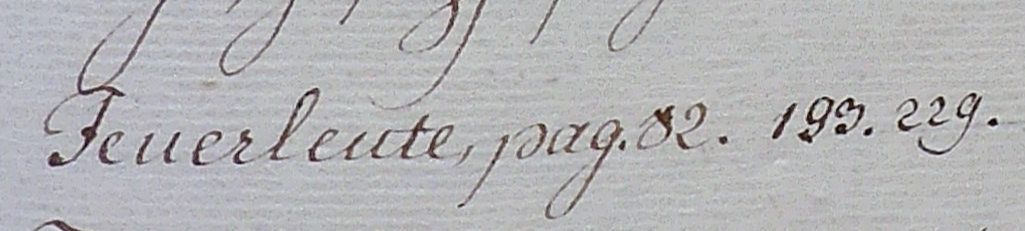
Feuerleute, pag. 82. 193. 229.
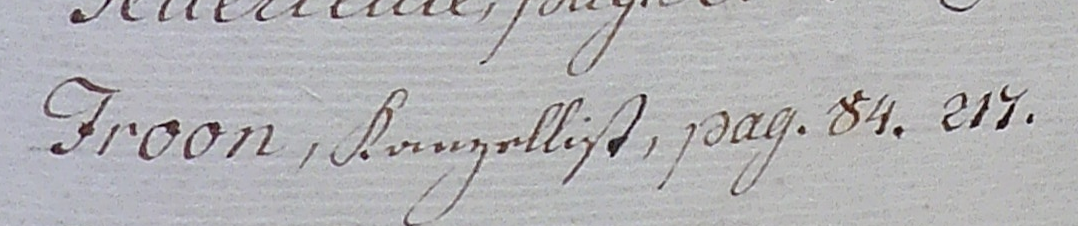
Froon, Kanzellist, pag. 84. 217.
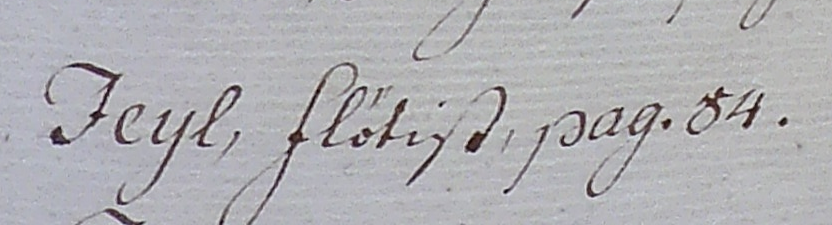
Feyl, Flötist, pag. 84.
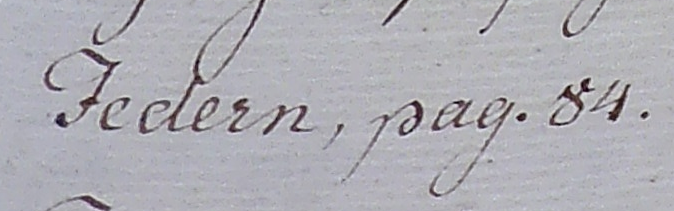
Federn, pag. 84.
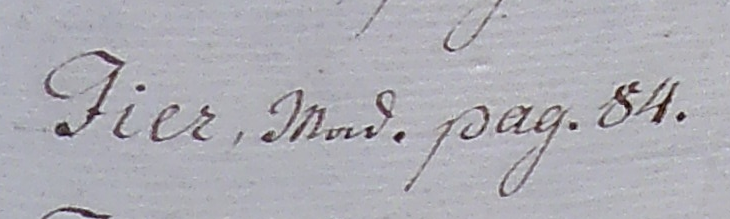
Fier, Mad. pag. 84.
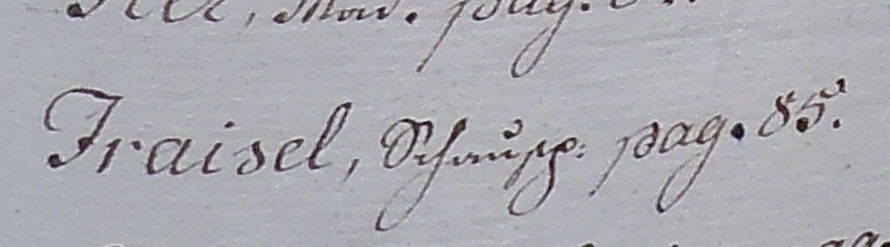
Fraisel, Schausp: pag. 85.
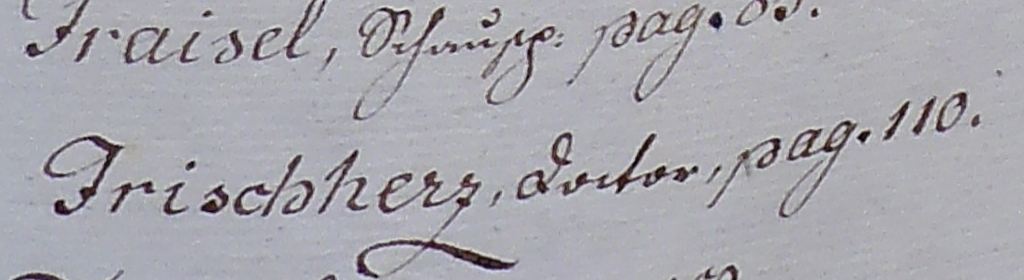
Frischherz, Doctor, pag. 110.
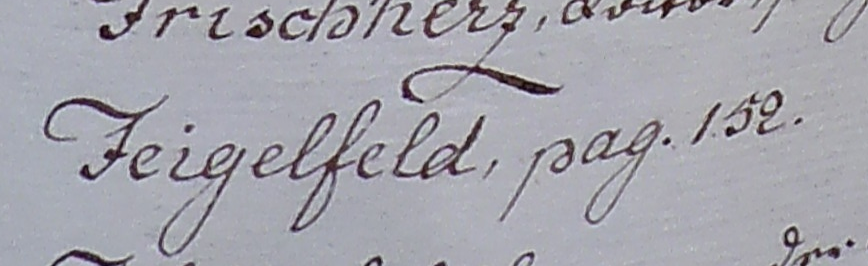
Feigelfeld, pag. 152.
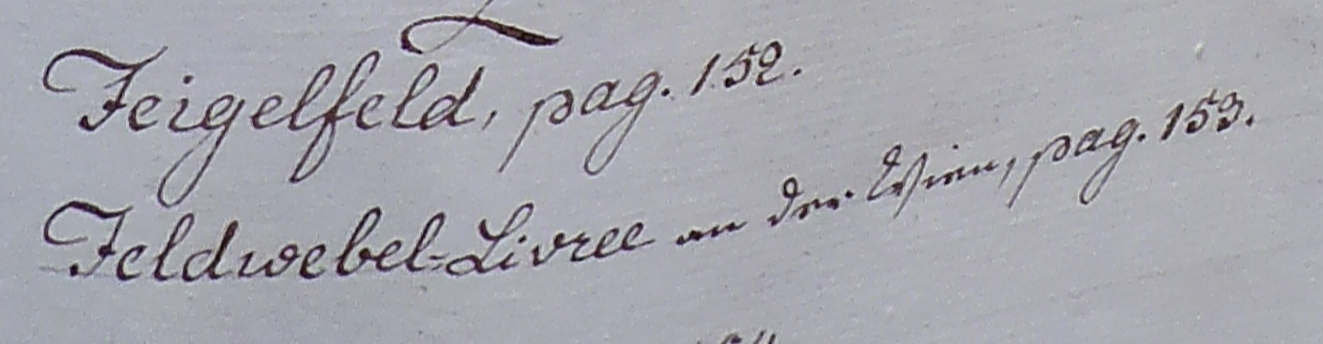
Feldwebel-Livree an der Wien, pag. 153.
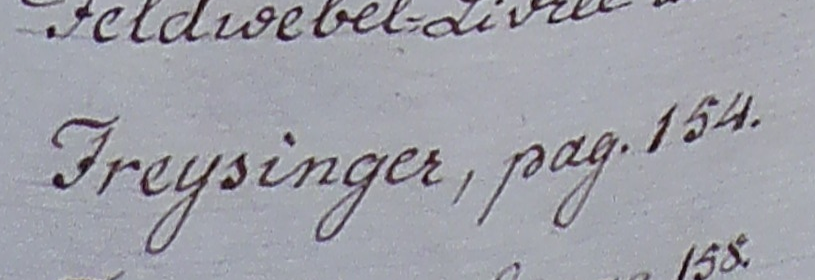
Freysinger, pag. 154.
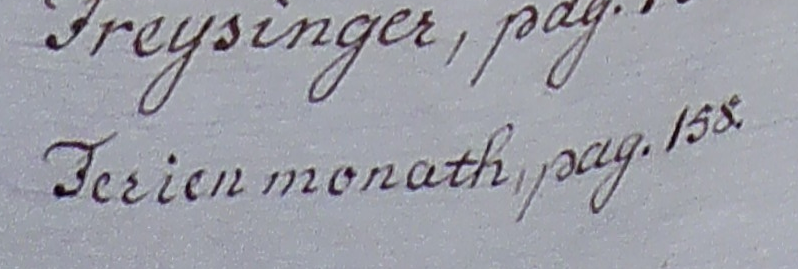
Ferienmonath, pag. 158.
